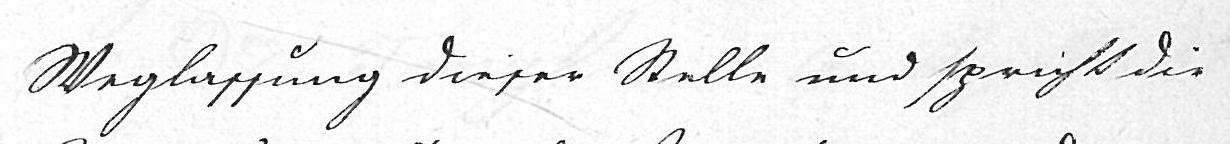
Weglassung dieser Stelle und spricht die
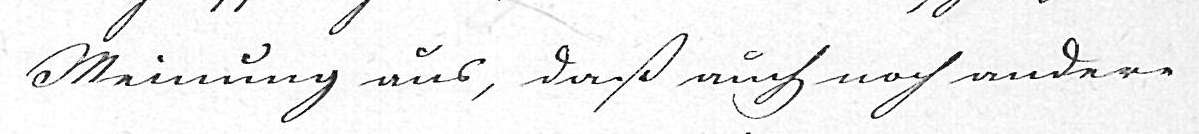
Meinung aus, daß auch noch andere
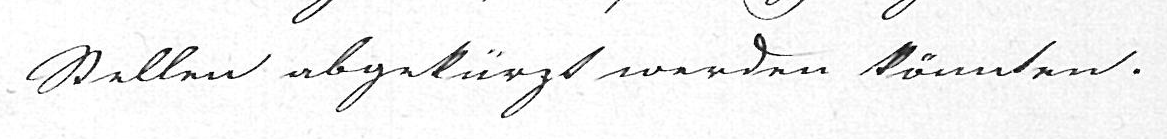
Stellen abgekürzt werden könnten.
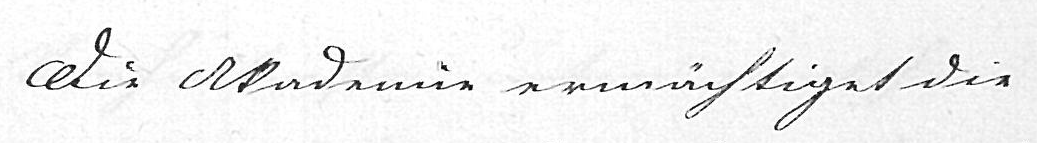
Die Akademie ermächtiget die
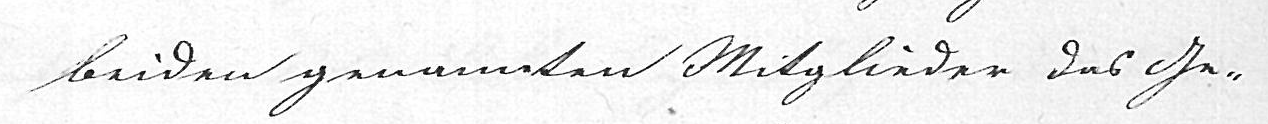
beiden genannten Mitglieder das Ge-
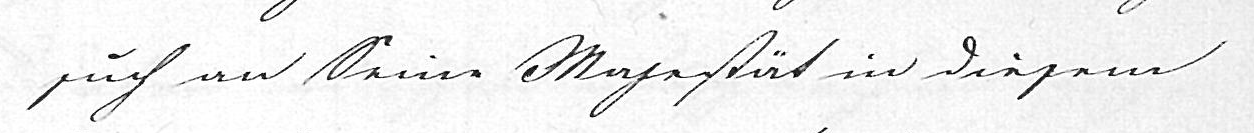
such an Seine Majestät in diesem
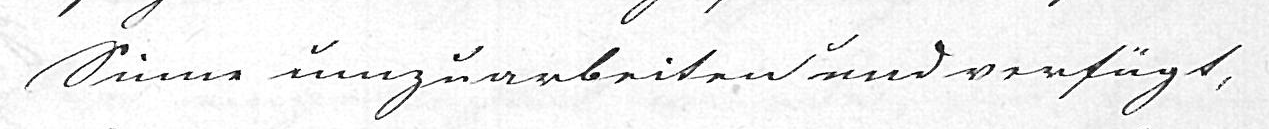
Sinne umzuarbeiten und verfügt,
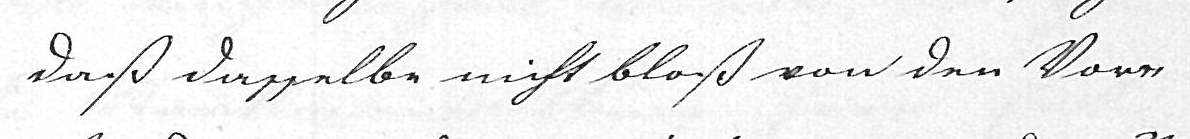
daß dasselbe nicht bloß von den Vor-
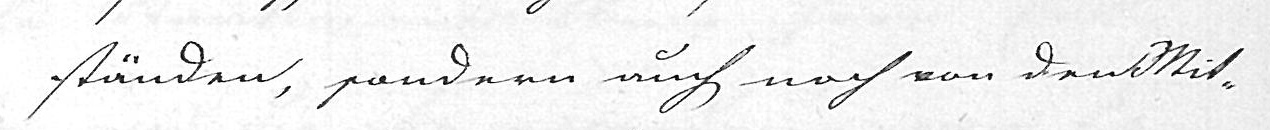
ständen, sondern auch noch von den Mit-
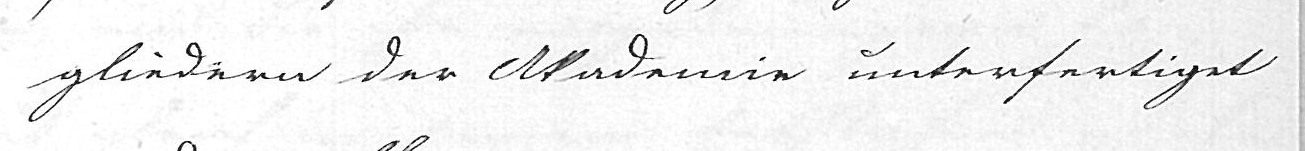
gliedern der Akademie unterfertiget
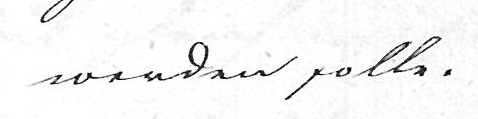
werden solle.
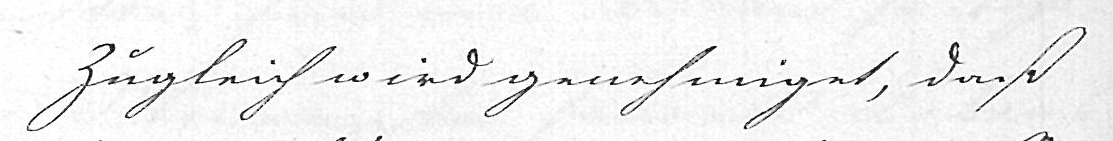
Zugleich wird genehmiget, daß
